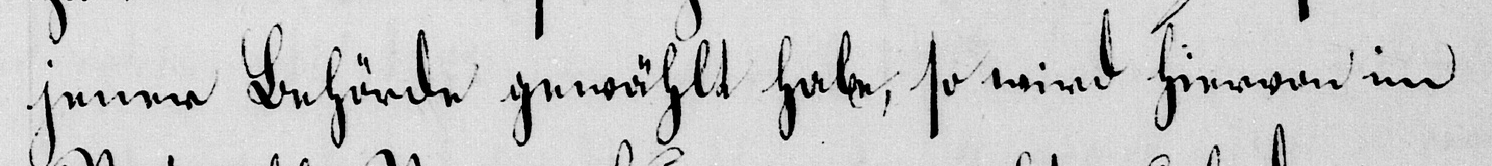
jener Behörde gewählt habe, so wird hiervon im
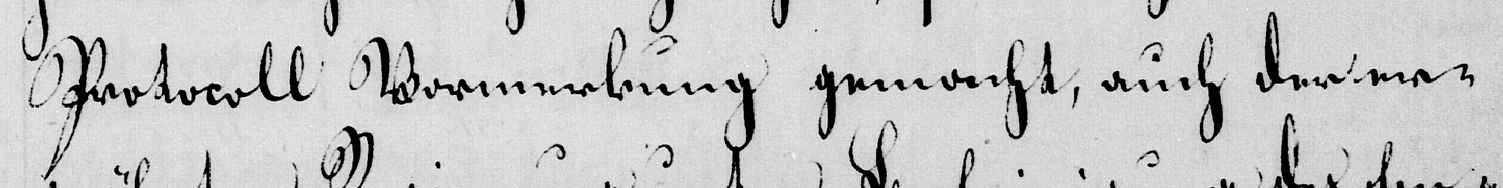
Protokoll Vormerkung gemacht, auch der er¬
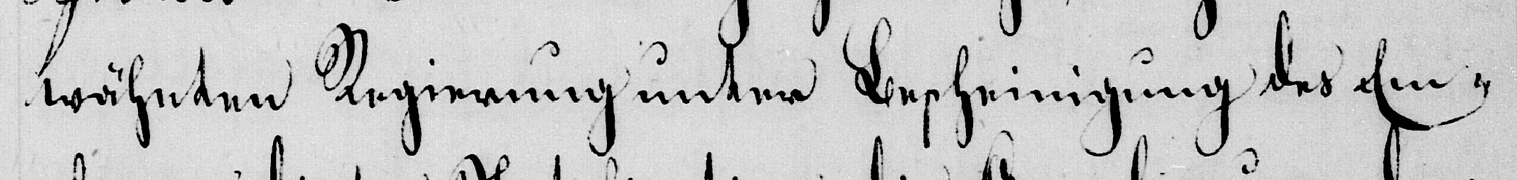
wähnten Regierung unter Bescheinigung des Em¬
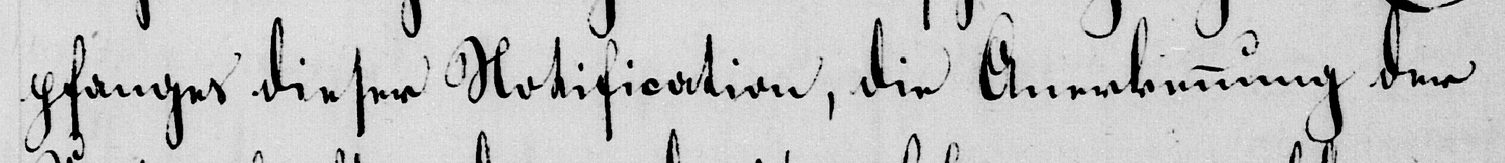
pfanges dieser Notification, die Anerkennung der
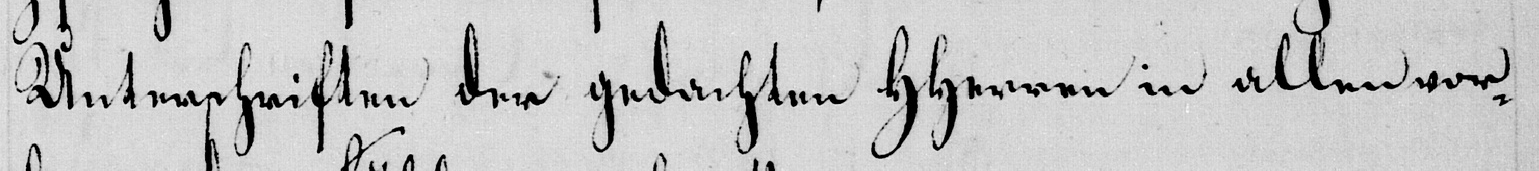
Unterschriften der gedachten HHerren in allen vor¬
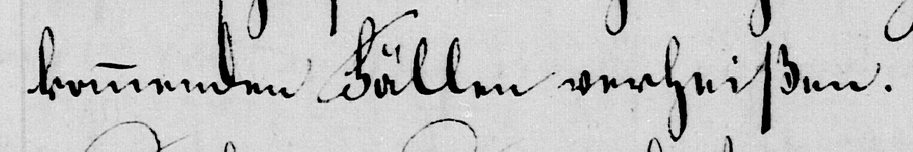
kommenden Fällen verheißen.
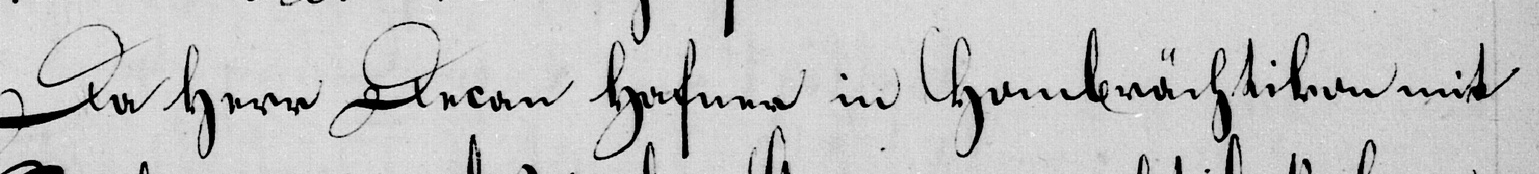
Da Herr Decan Hafner in Hombrächtikon mit
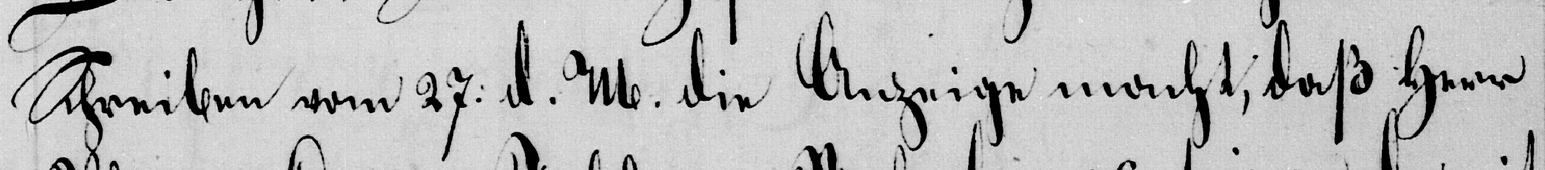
Schreiben vom 27. d. M. die Anzeige macht, daß Herr
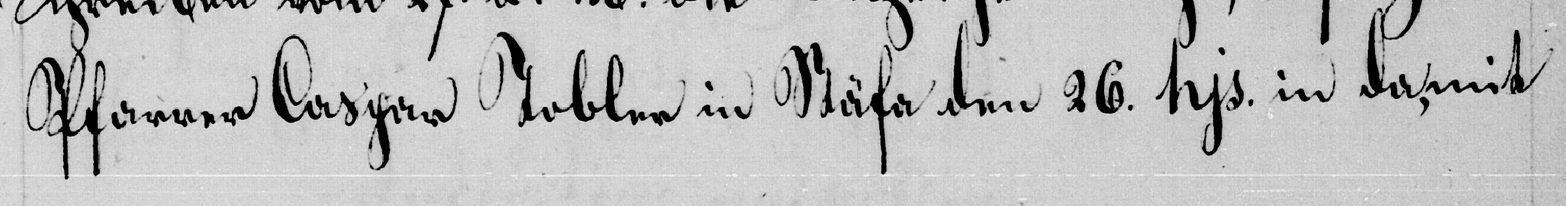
Pfarrer Caspar Tobler in Stäfa den 26. hjs. in da mit
